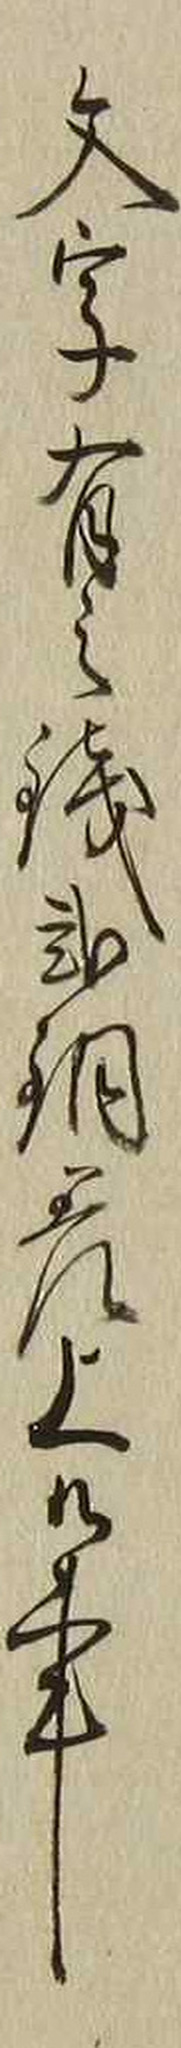文字有之銭弐銅差上候事
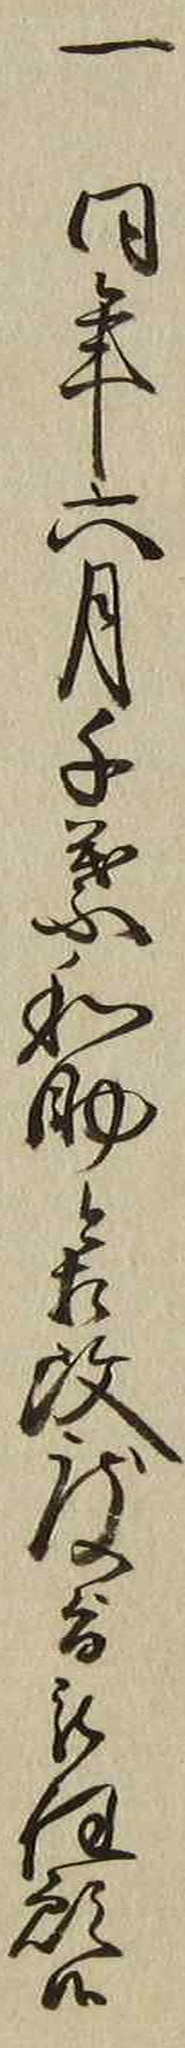一同年六月千葉和助と相改度旨被伺願候
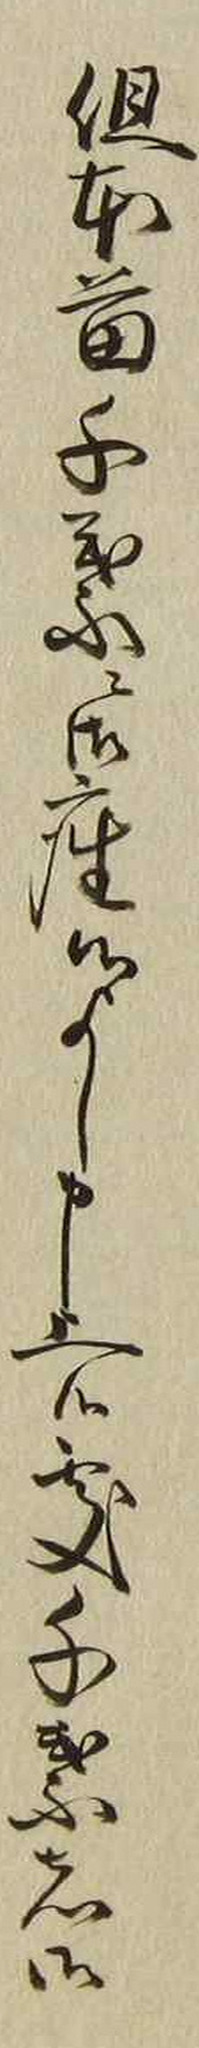但本苗千葉ニ御座候よし申上候處千葉者御
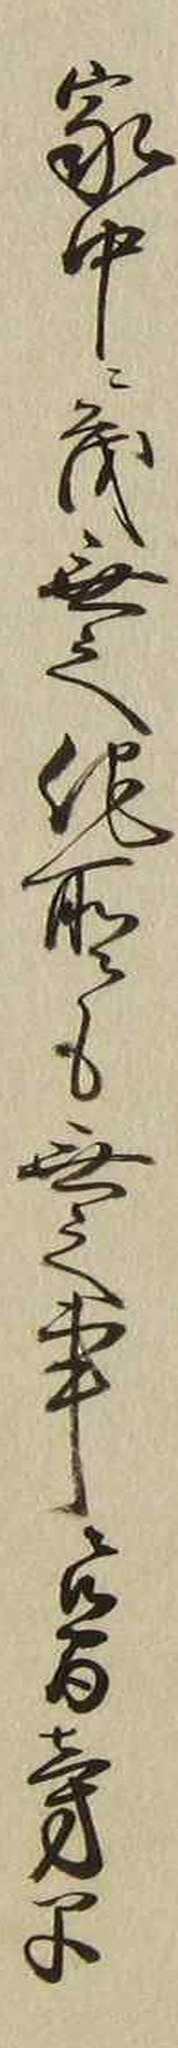家中ニ茂無之他所ニも無之事ニ候旨旁早
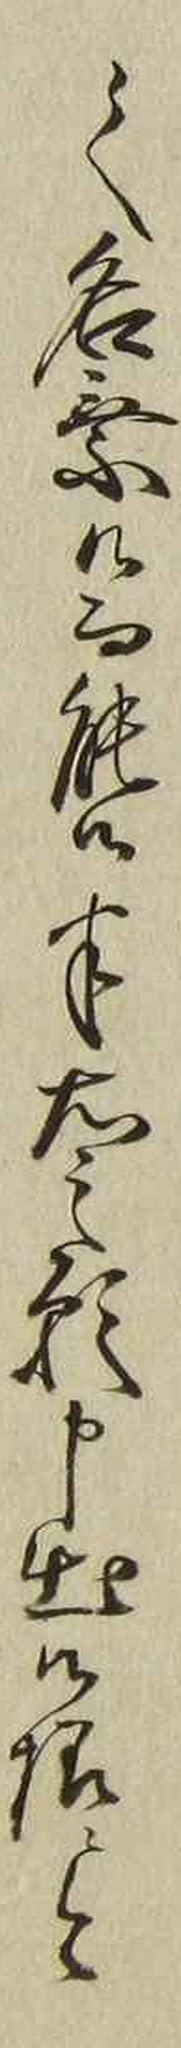之名乗候而能候半右之願申出候様ニと
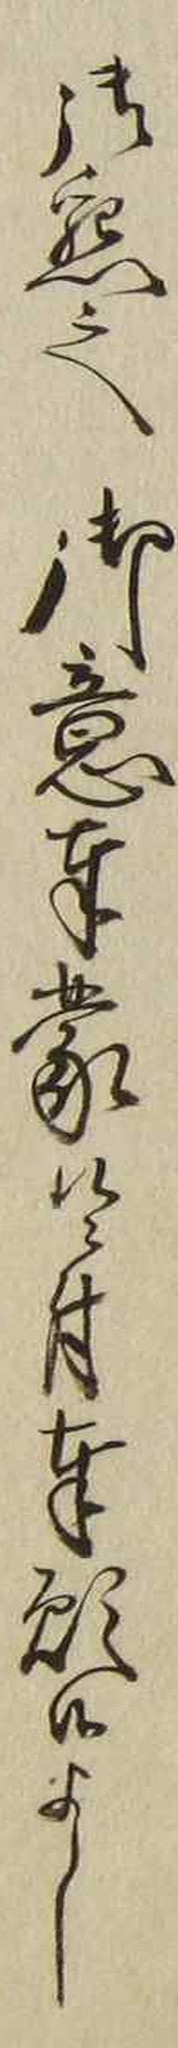御懇之御意奉蒙候ニ付奉願候よし

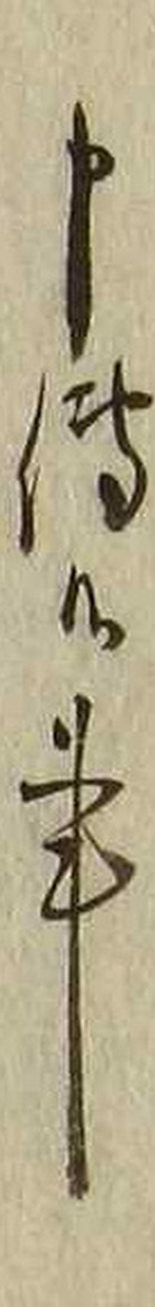申伝候事
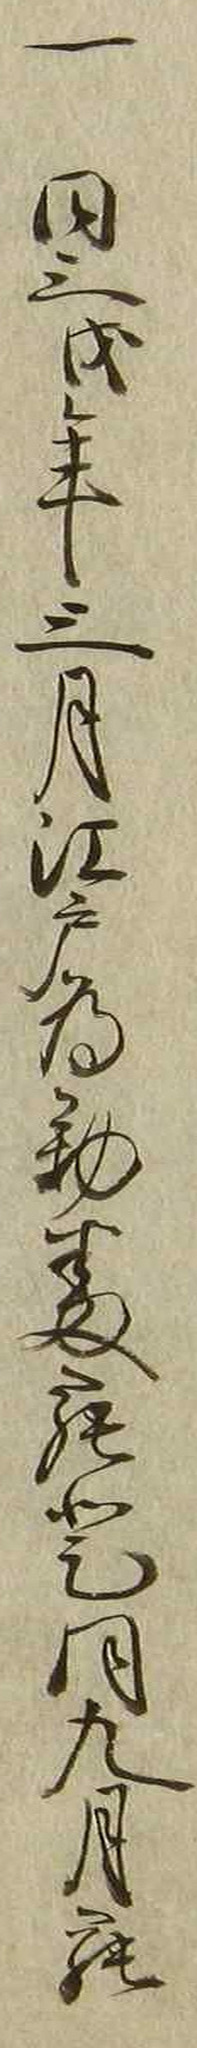一同三戌年三月江戸為勤番罷登同九月罷
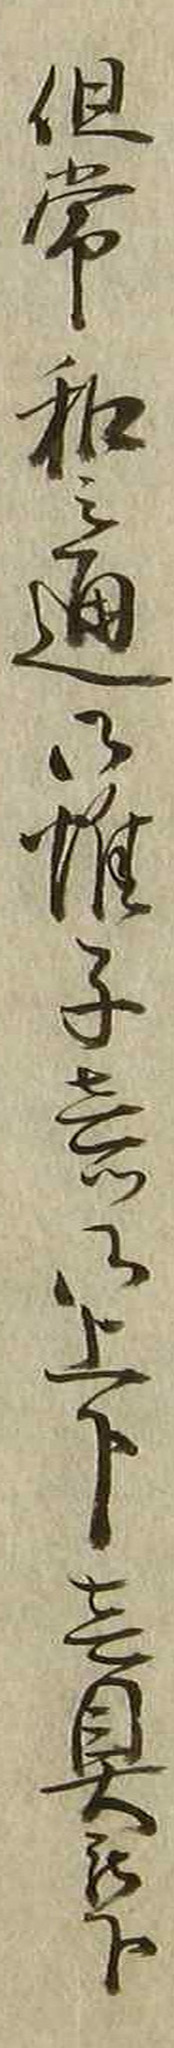但常和之通御帷子壱ツ御上下壱具被下
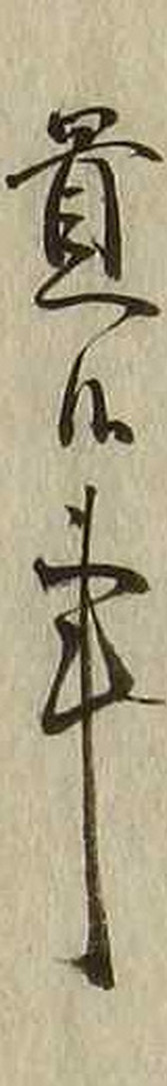置候事
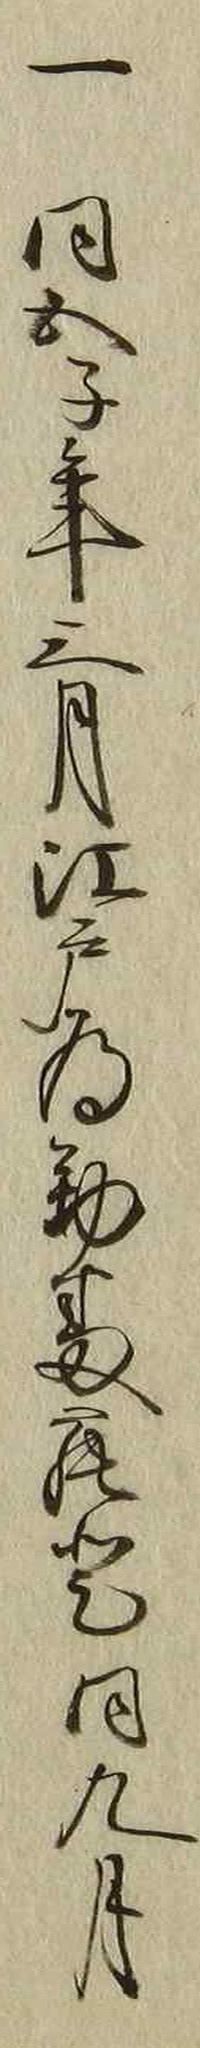一同五子年三月江戸為勤番罷登同九月
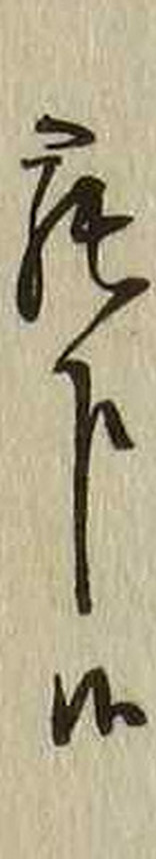罷下候
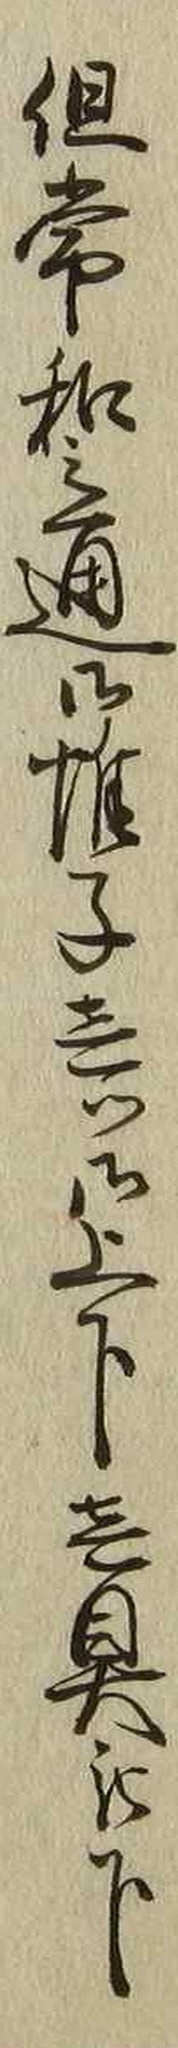但常和之通御帷子壱ツ御上下壱具被下
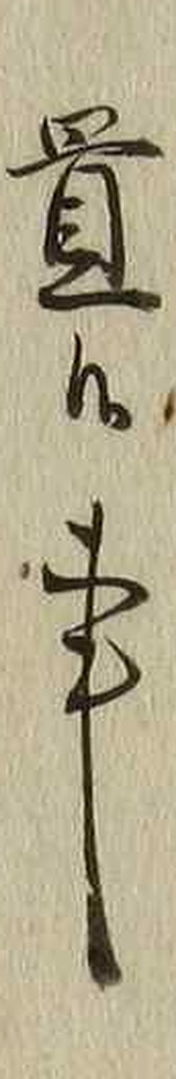置候事
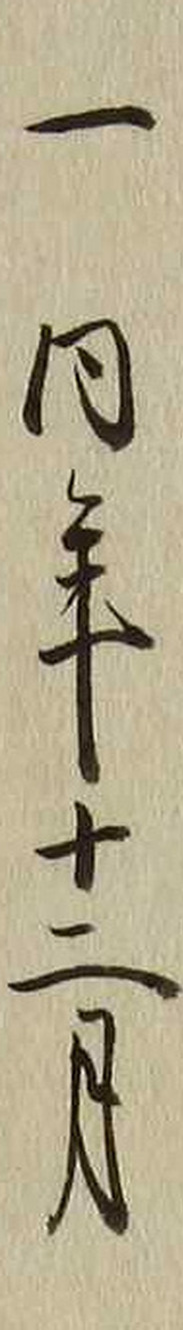一同年十二月
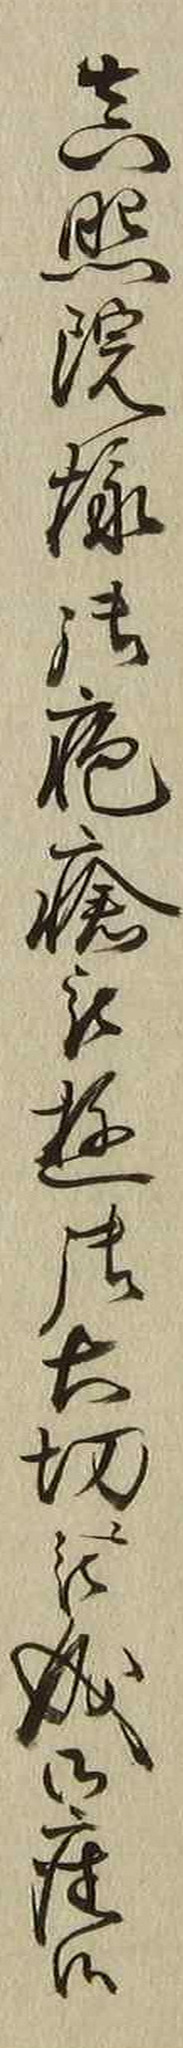真照院様御疱瘡被遊御大切ニ被成御座候
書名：諸士系譜　巻之65　ち之部1
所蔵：会津若松市立会津図書館
